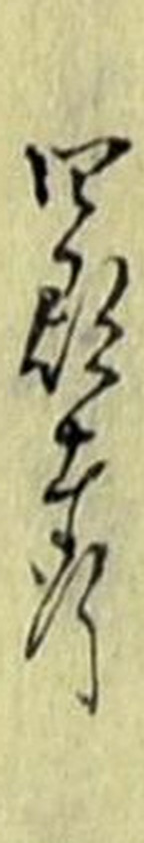四郡奉行
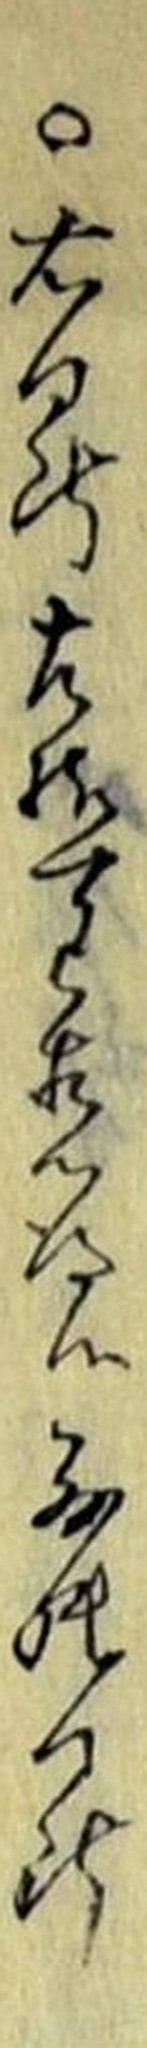○右同断左様可被相心得候別紙同断

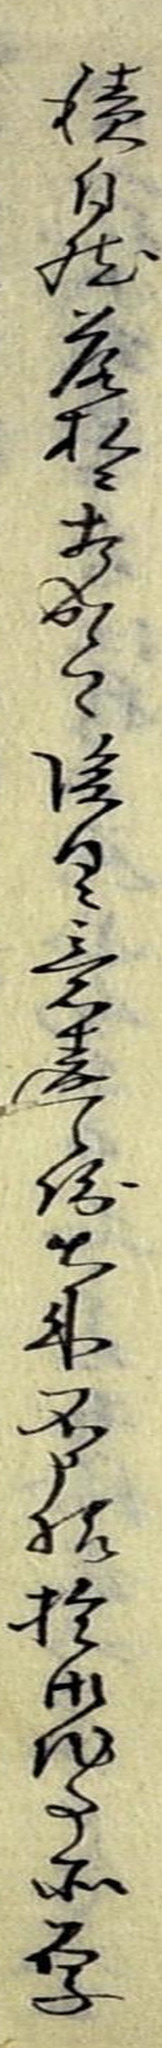積自然落札ニ相成候ハヽ後日ニ意違候儀出来不申様於御作事所厚
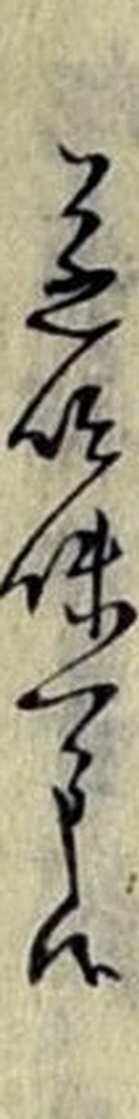遂吟味可申候
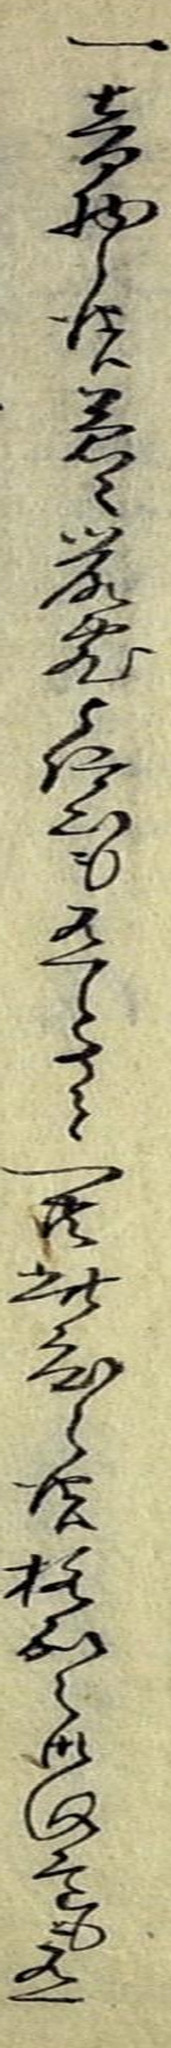一音物之儀ハ兼々厳敷被仰出も有之事ニ候へ共此度之儀ハ格別之御趣意も有
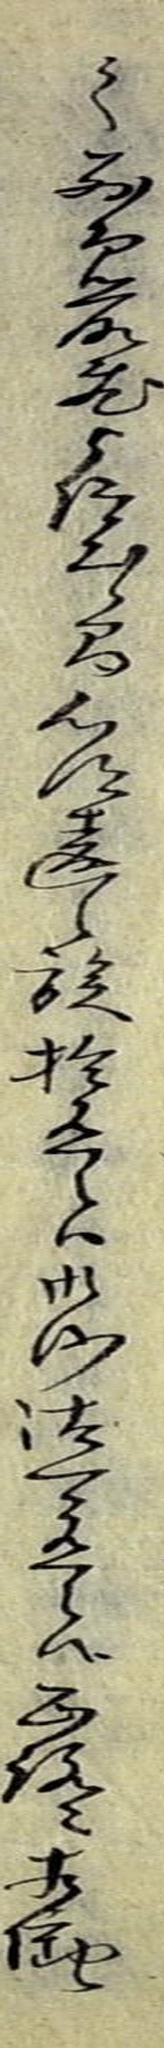之別而厳敷被仰出候間心得違之族於有之ハ御沙汰可有之候正路ニ相働候
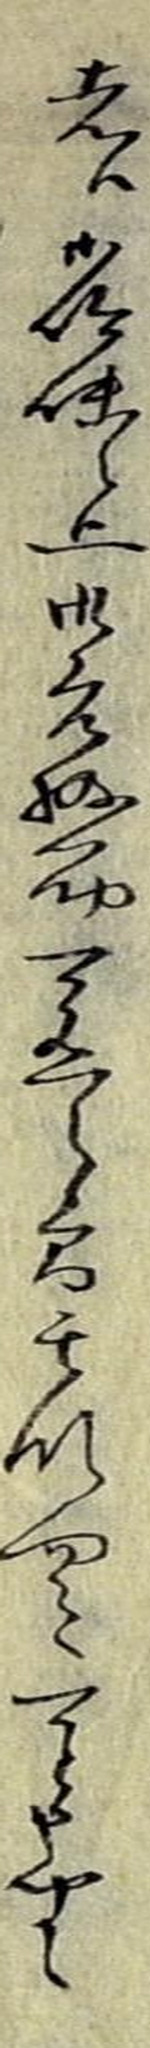者は御吟味之上御取扱筋可有之候間其段向々へ可被申聞候
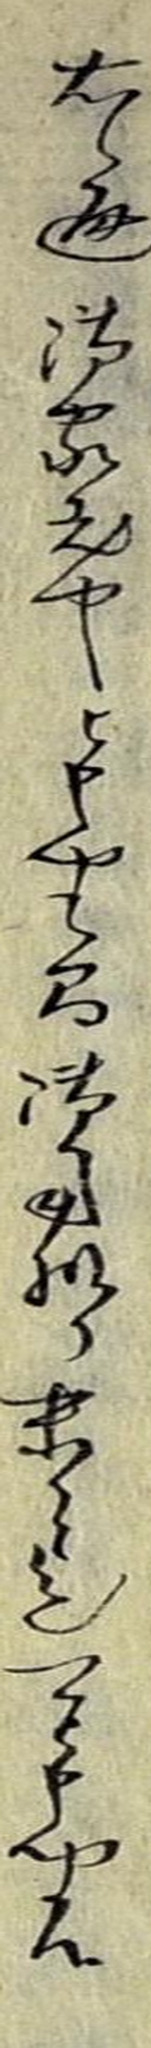右之通御家老中被申聞候間御用掛り末々迄可被申聞候
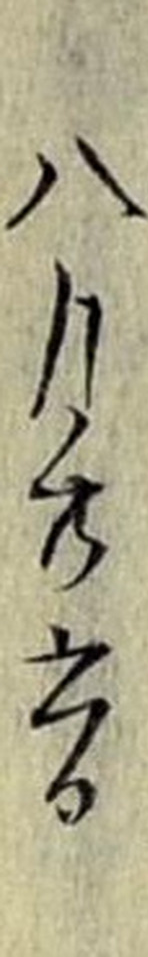八月廿六日
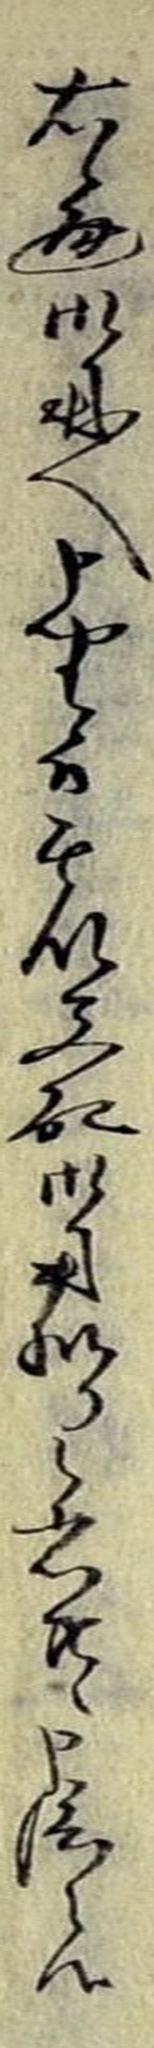右之通御用人申聞ニ付其段支配御用掛り之者共へ申渡し候
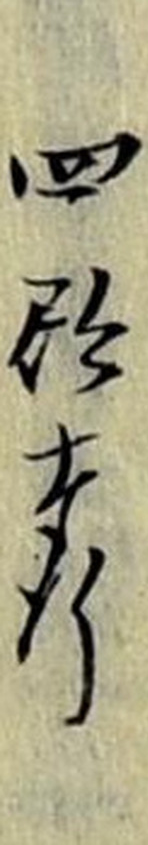四郡奉行
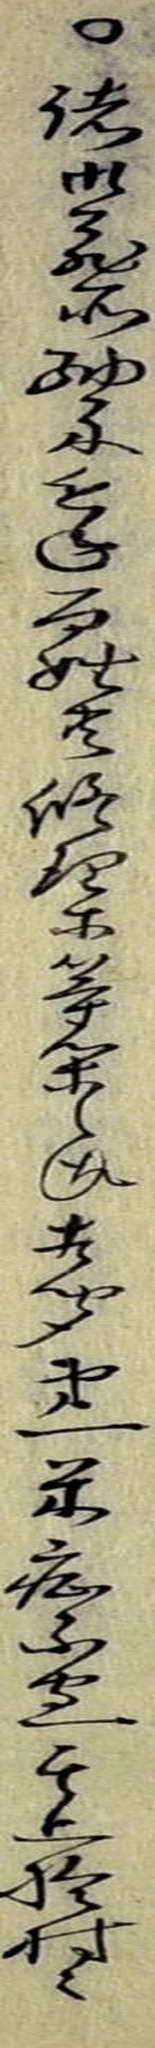○諸御蔵所納米近年百姓共修理等等閑之趣相聞第一米症不宜其上於村々
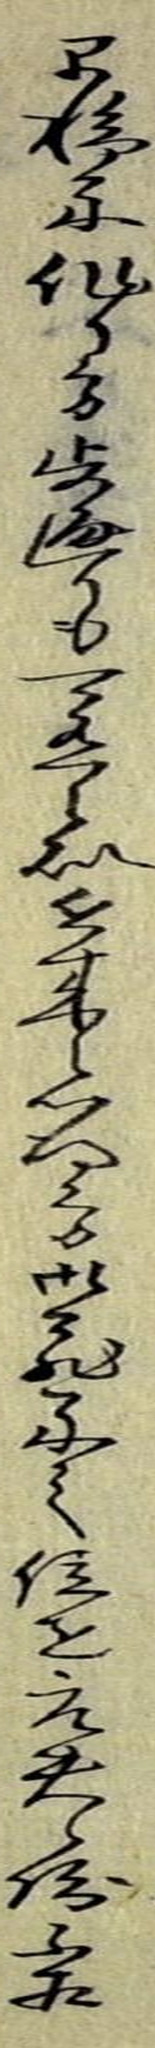早稲米作り方歩通りも可有之処近来之心得方御蔵米之位を取決候儀不相
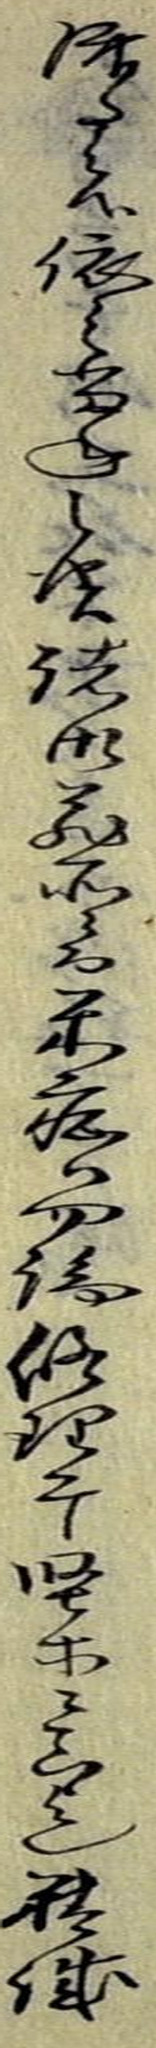済事ニ候依之当年之儀諸御蔵所ニ而米症ハ勿論修理干堅等ニ至迄精誠
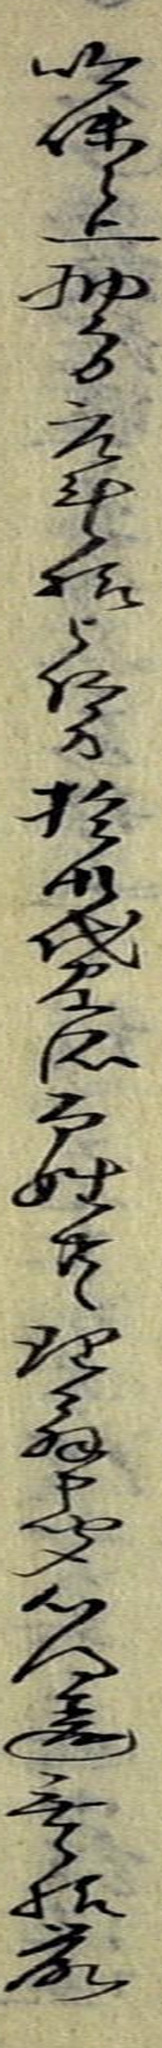吟味之上納方取計候様被仰付於御代官所百姓共へ理解申聞心得違無之様落
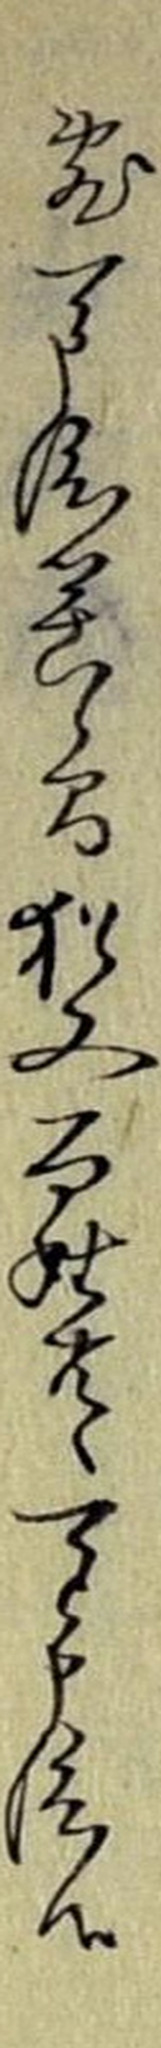敷可申儀筈候間猶又百姓共へ可被申渡候
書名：命令之部 五
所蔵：福井県文書館 Fukui Prefectural Archives
